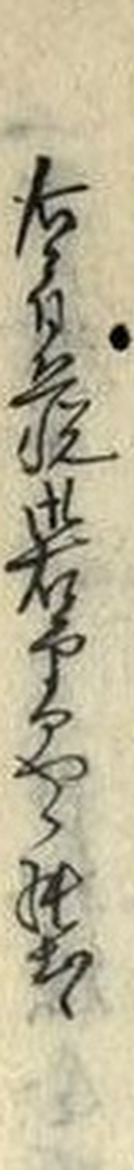右ニ付恐悦御右筆部屋へ罷出候

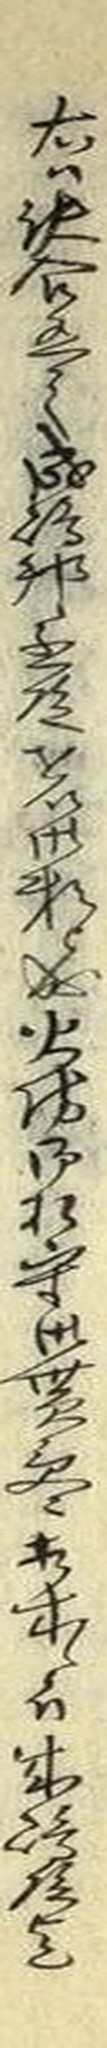右ハ訳合有之成嶋邦之丞殿を以御頼被成火防御札守御貰受ニ相成候ニ付成嶋殿迄
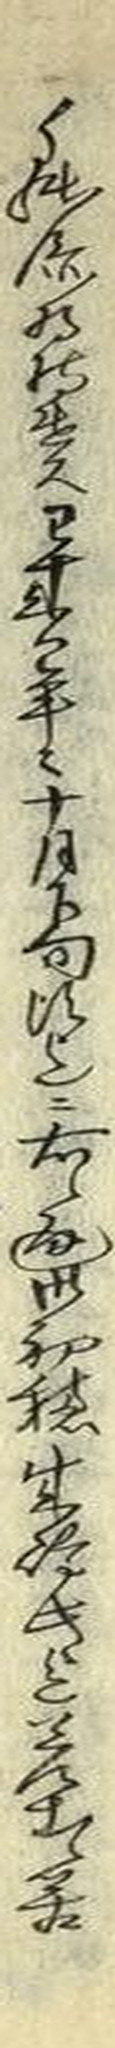手紙添為持遣ス已来ハ年々十月下旬頃迄ニ右之通御初穂成嶋氏迄差出候筈
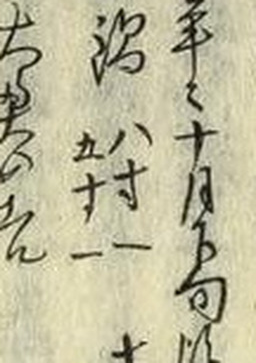五寸一
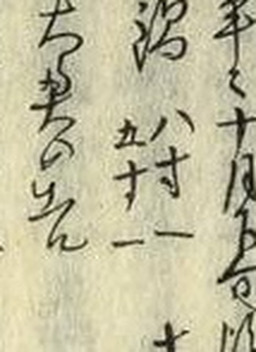五寸一
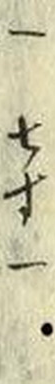五寸一
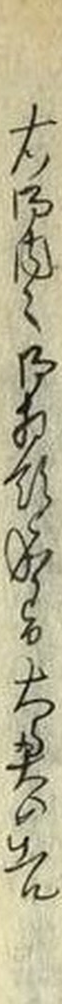右御内々御拝領被成候旨大奥ゟ出ル
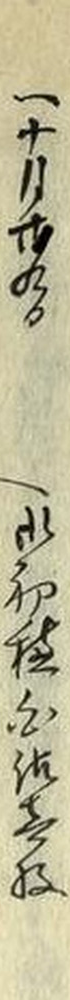一十月廿九日御初穂白銀壱枚
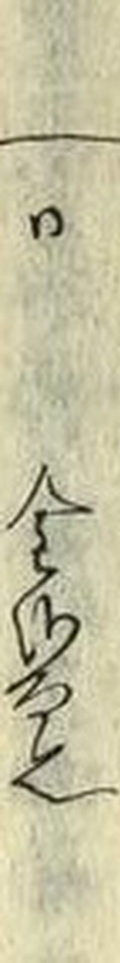同金弐百疋
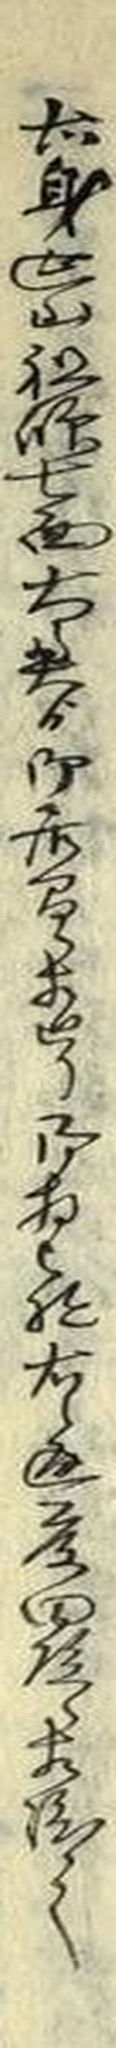右身延山祖師七面大奥ゟ御居間へ相廻り御拝被遊右之通藤田殿へ相渡之
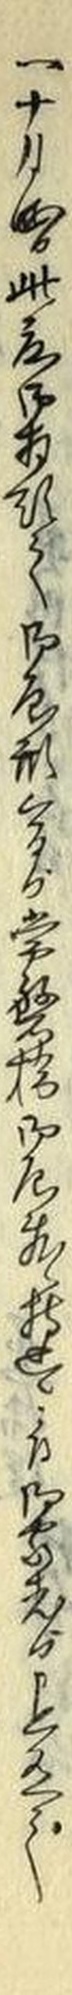一十月晦日此度御拝領之御屋形今日ゟ常盤橋御屋敷へ持込候ニ付御家老ゟ申上有之
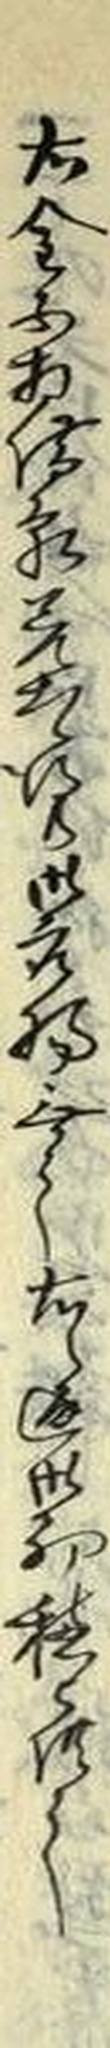右金子拝借願差出候得共御取揚無之右之通御初穂被供之
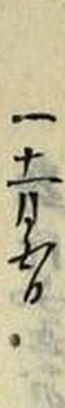一十一月六日
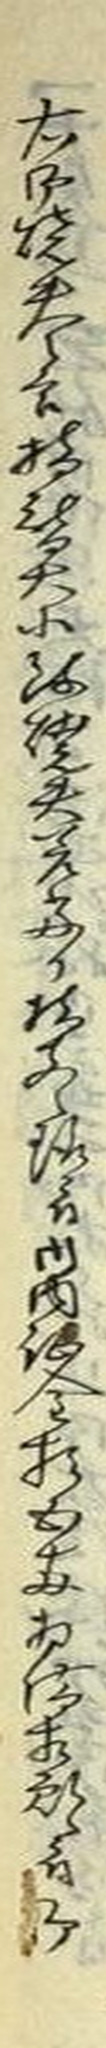右御焼失之節指替大小致焼失差当り指支候趣ニ付御内証金拾五両拝借相願候ニ付御
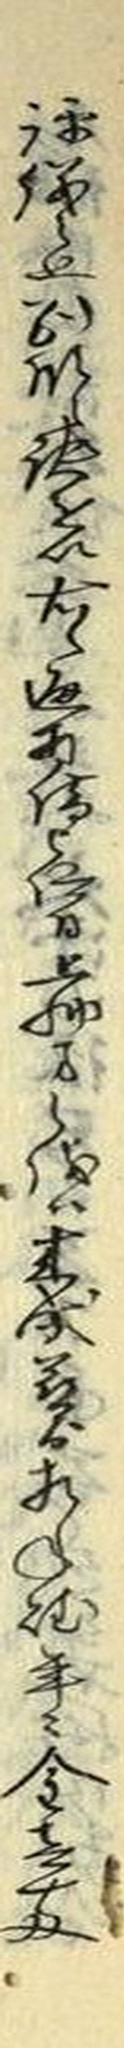評議之上別段之訳を以右之通拝借被仰付上納方之儀ハ来戌暮ゟ拾年賦年々金壱両
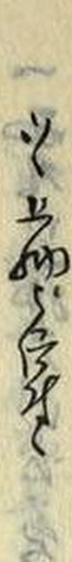ツヽ上納被仰付候
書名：少傅日録抄（斉善付側向頭取日記、在府）
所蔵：福井県文書館 Fukui Prefectural Archives
